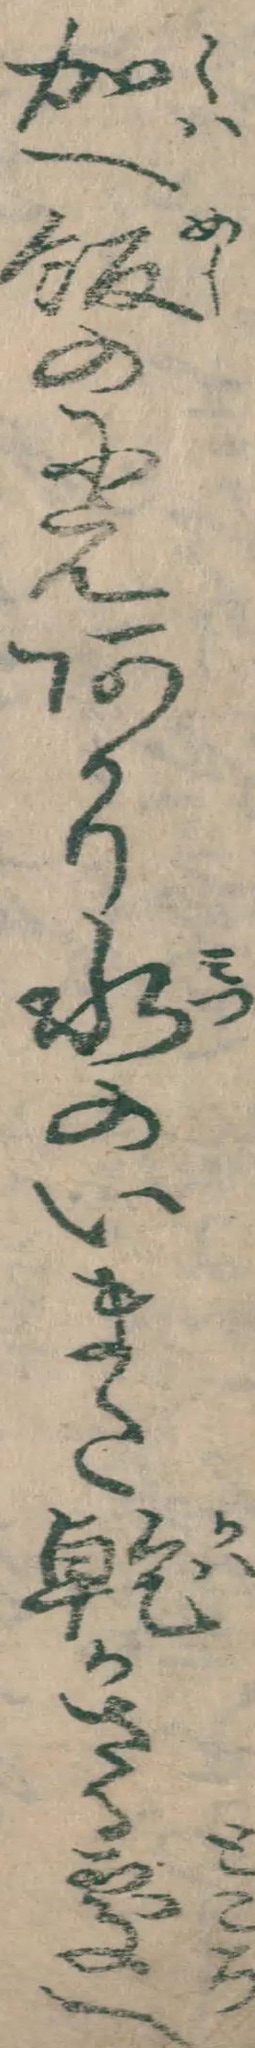加へ飯のにえあかり水のいまた乾かさる処へ
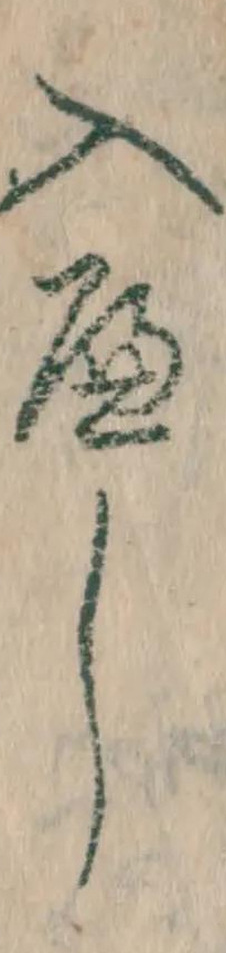入べし
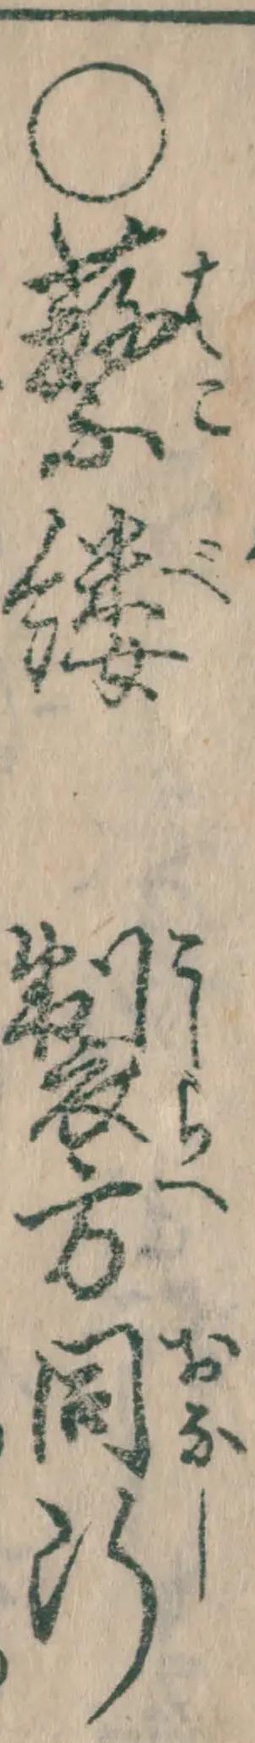〇蘩縷製方同断
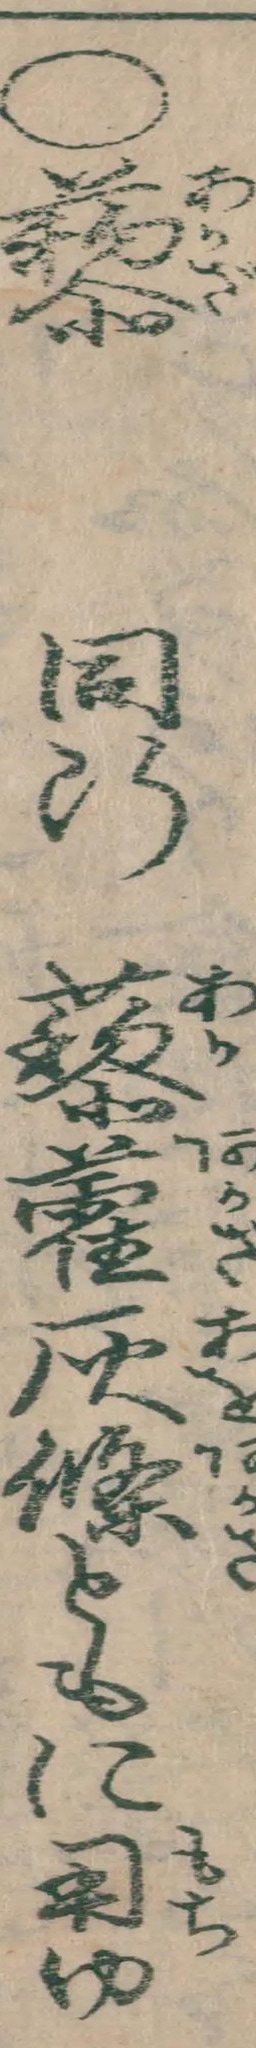〇藜同断藜藿灰條ともに用ゆ
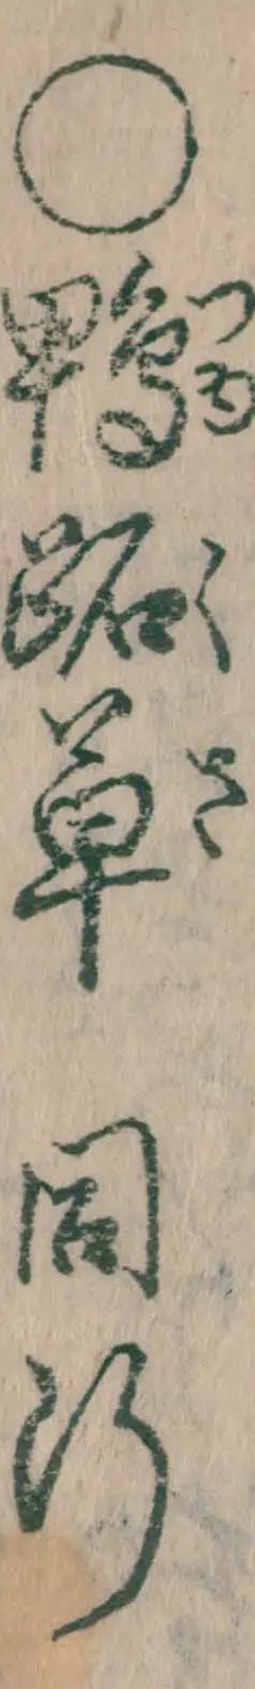〇鴨跖草同断
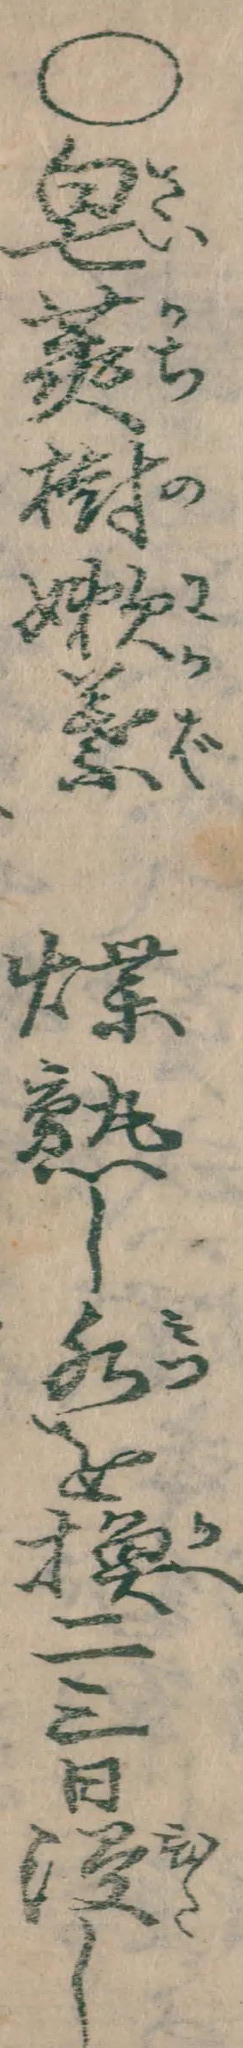〇皂莢樹嫩葉爛熟し水を換ニ三日浸し
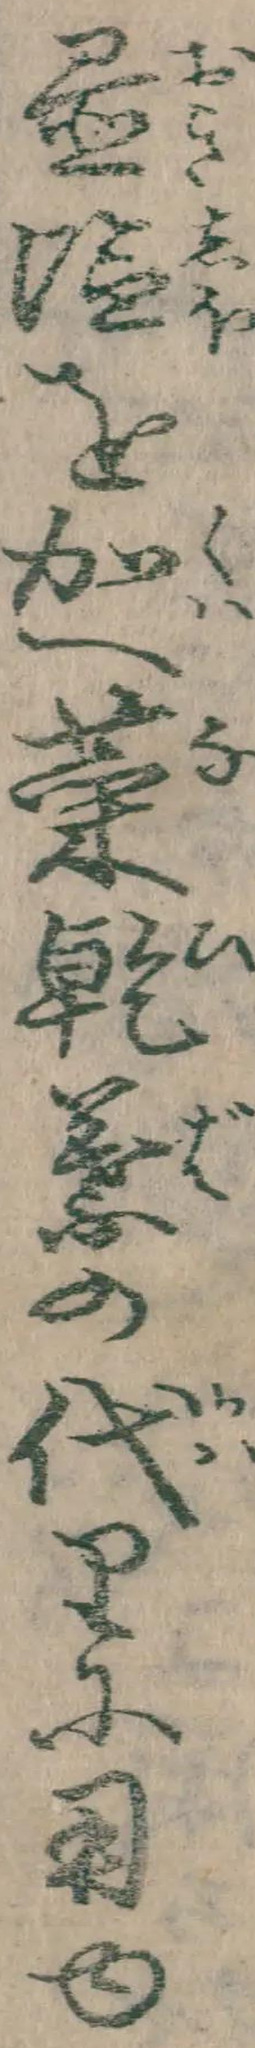置塩を加へ菜乾葉の代りに用ゆ
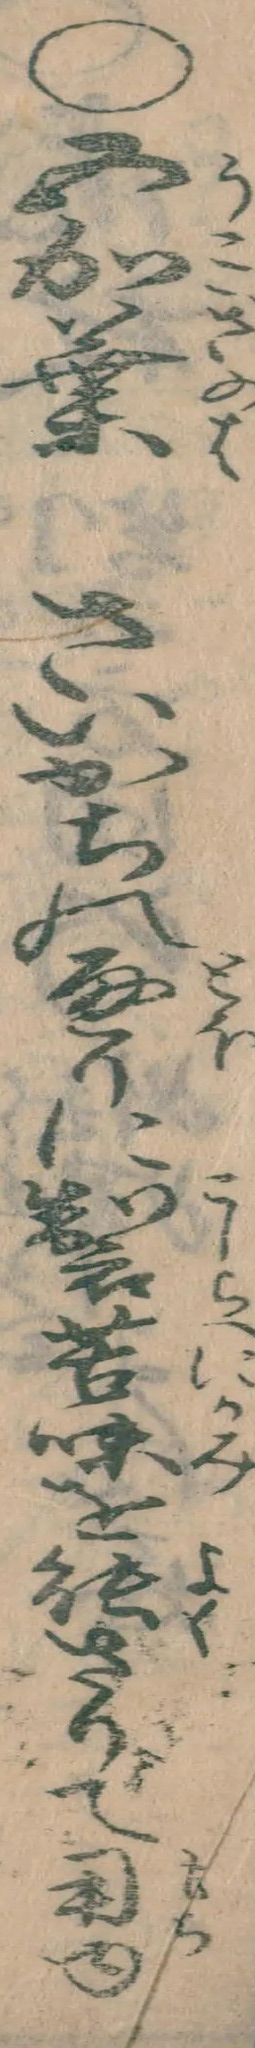〇五加葉さいかちの通りに製苦味を能さりてよう用ゆ
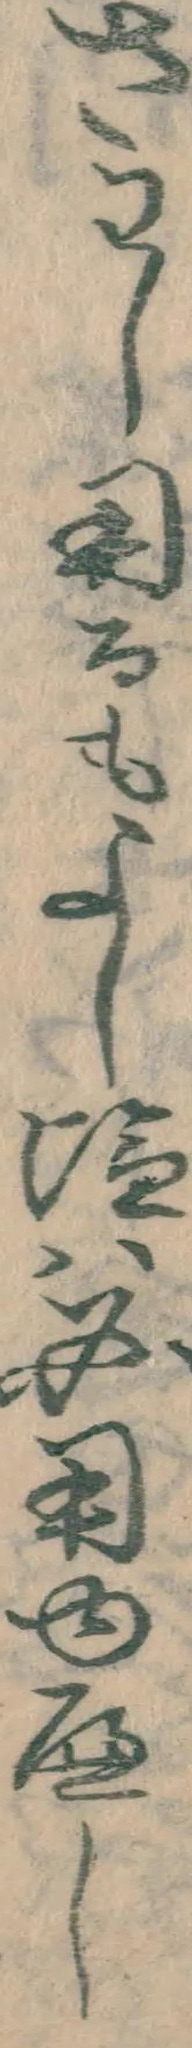さわし用るもよし塩は必用ゆべし
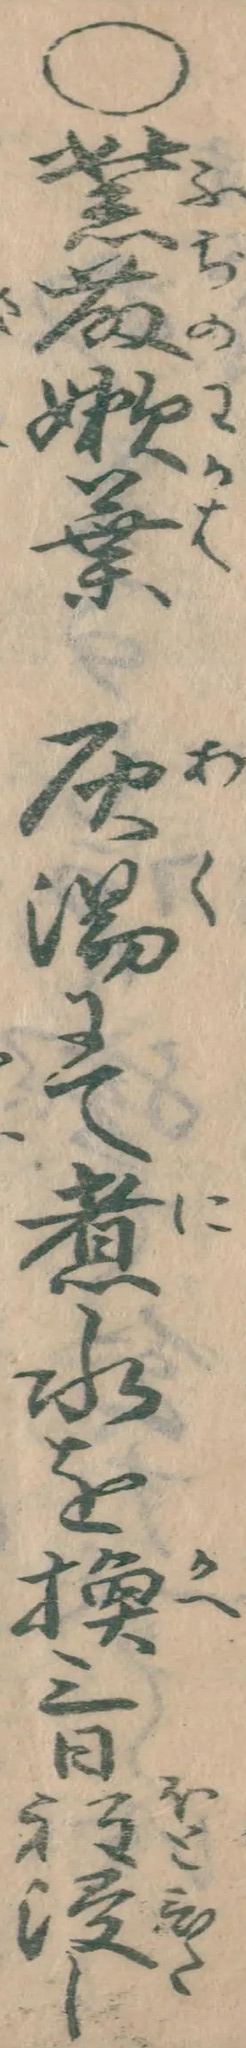〇紫藤嫩葉灰湯にて煮水を換三日程浸し
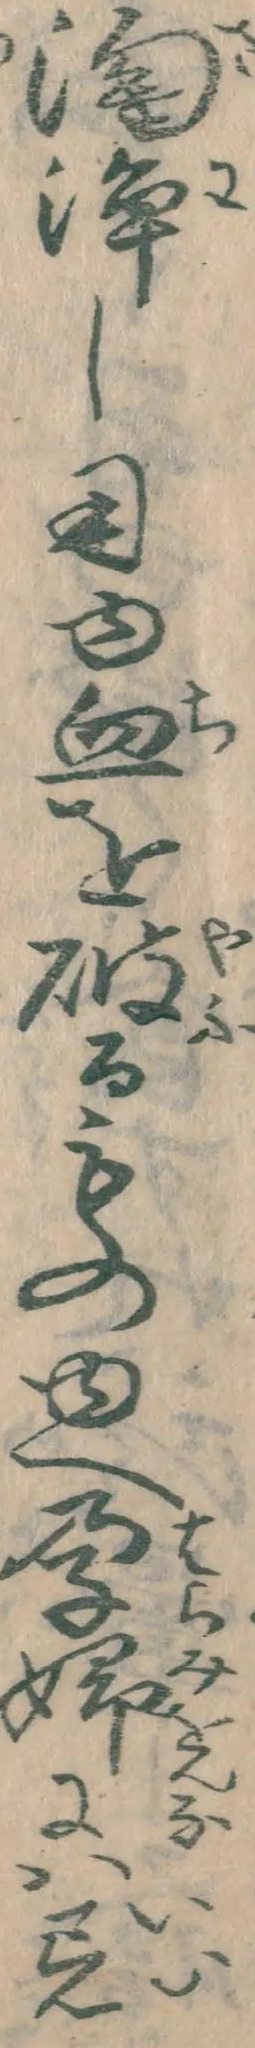淘浄し用ゆ血を破るものゆへ孕婦には忌
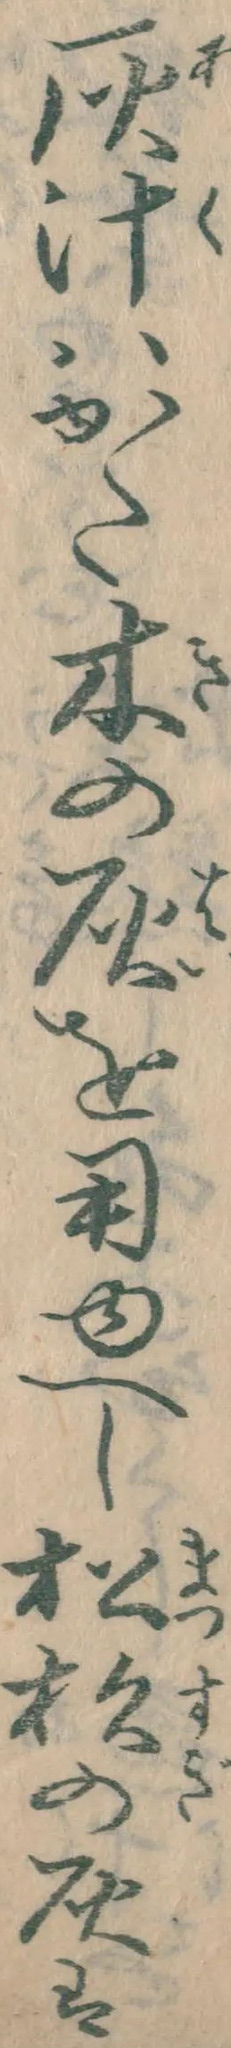灰汁はかた木の灰を用ゆべし松杉の灰は
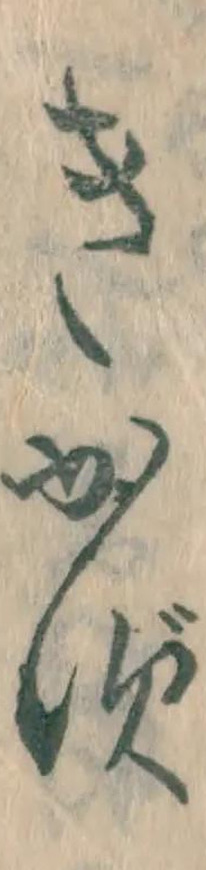きかず

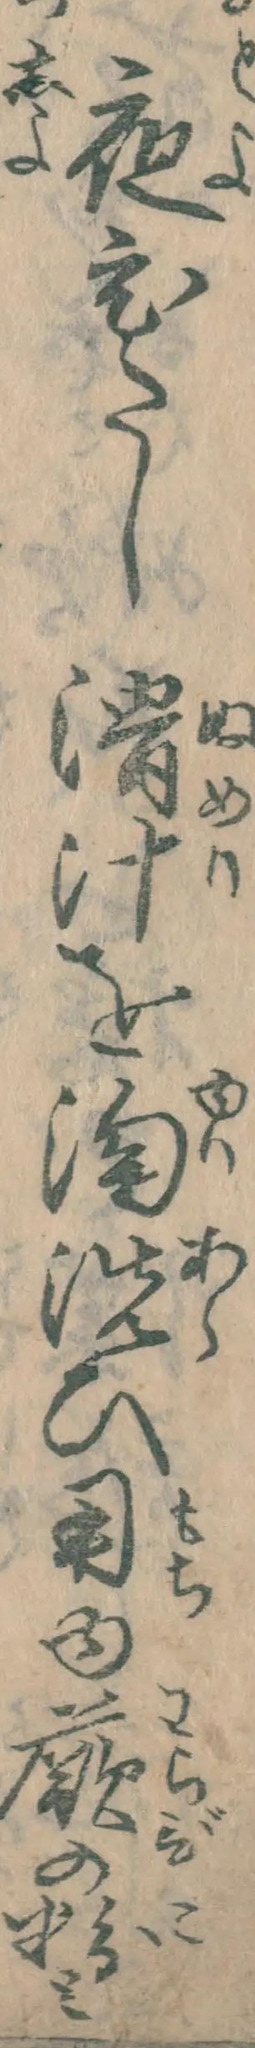一夜ひたし滑汁を淘洗い用ゆ蕨の粉と
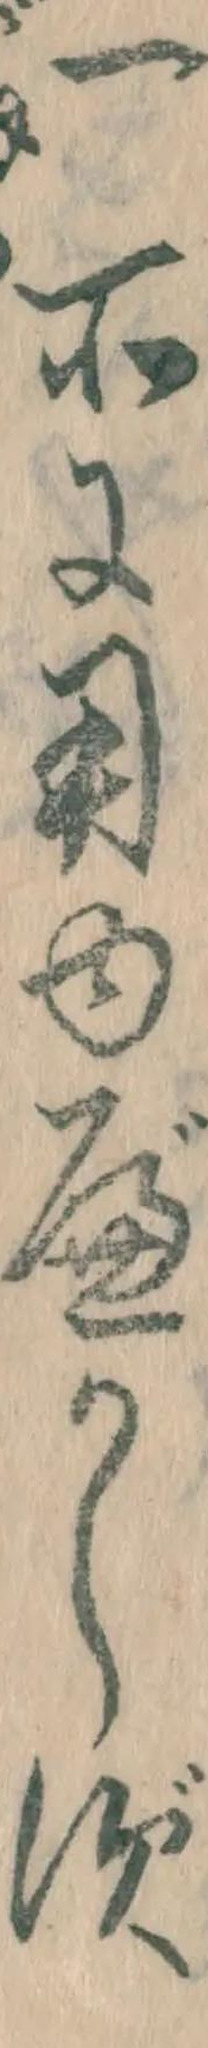一所に用ゆべからず
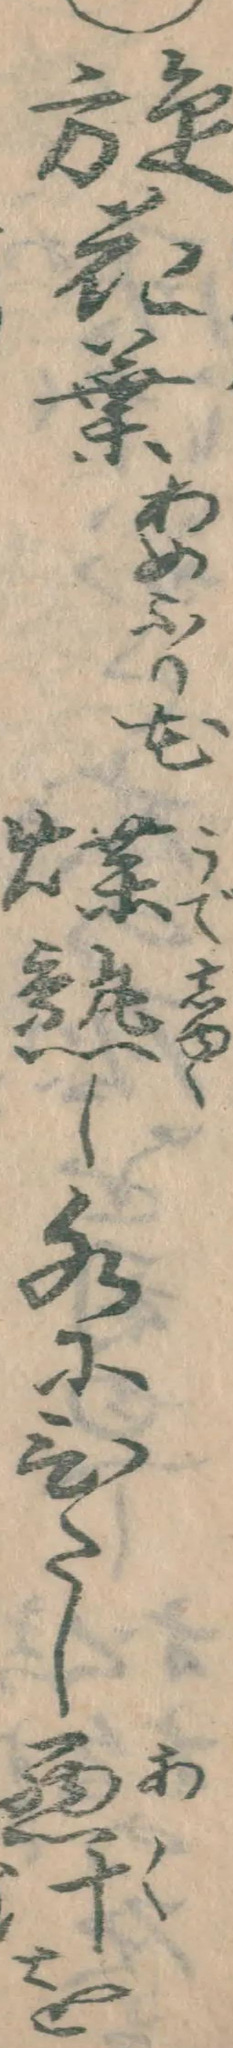〇旋花葉あめふり花爛熟し水にひたし悪汁を
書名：救荒鄙諭
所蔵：国立国会図書館 National Diet Library, JAPAN
